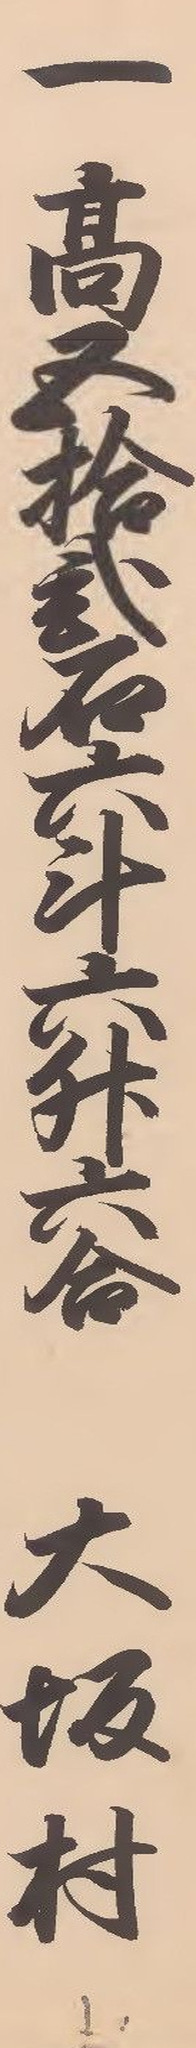一高五拾弐石六斗六升六合大坂村
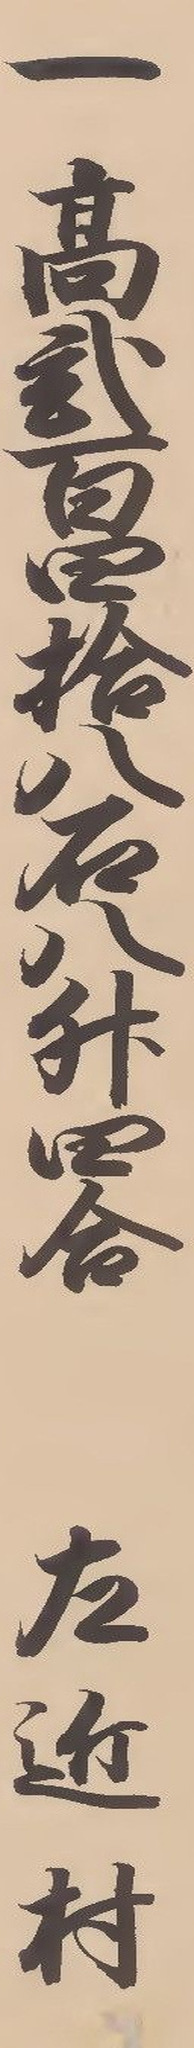一高弐百四拾八石八升四合左近村
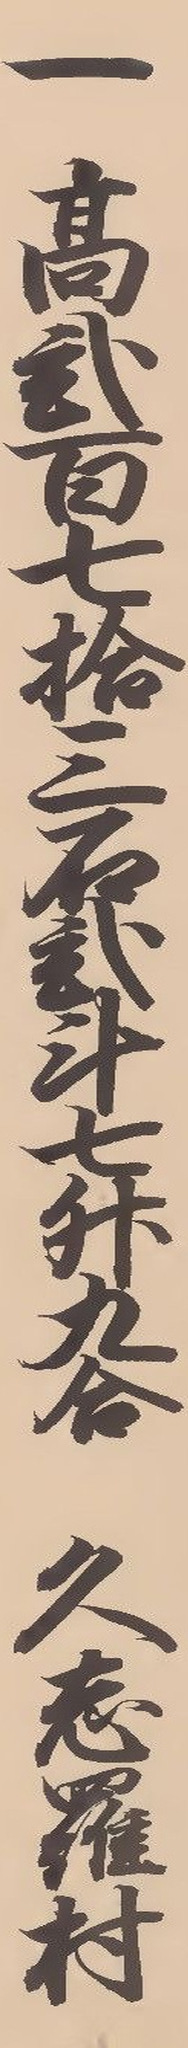一高弐百七拾三石弐斗七升九合久志羅村
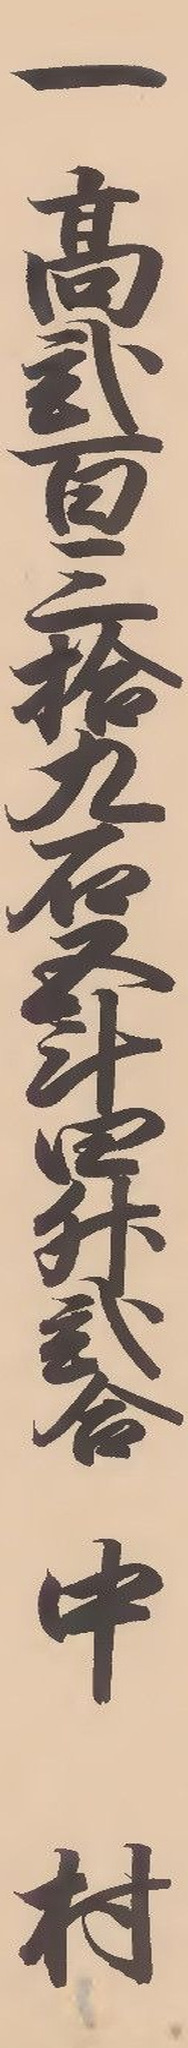一高弐百三拾九石五斗四升弐合中村
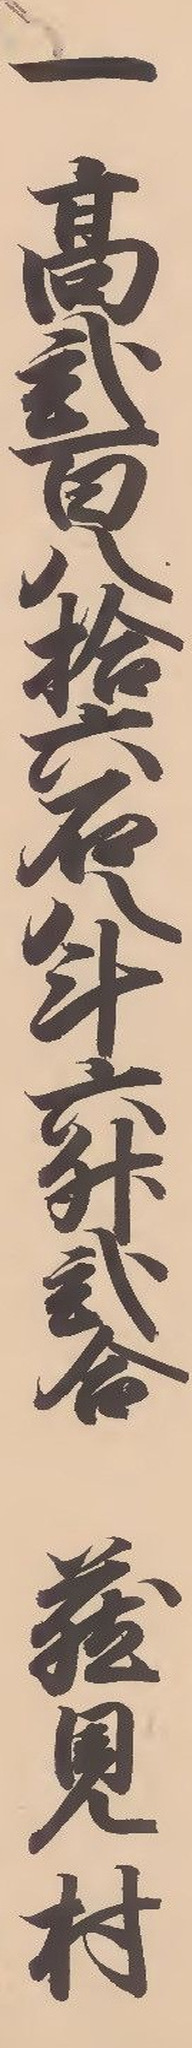一高弐百八拾六石八斗六升弐合蔵見村

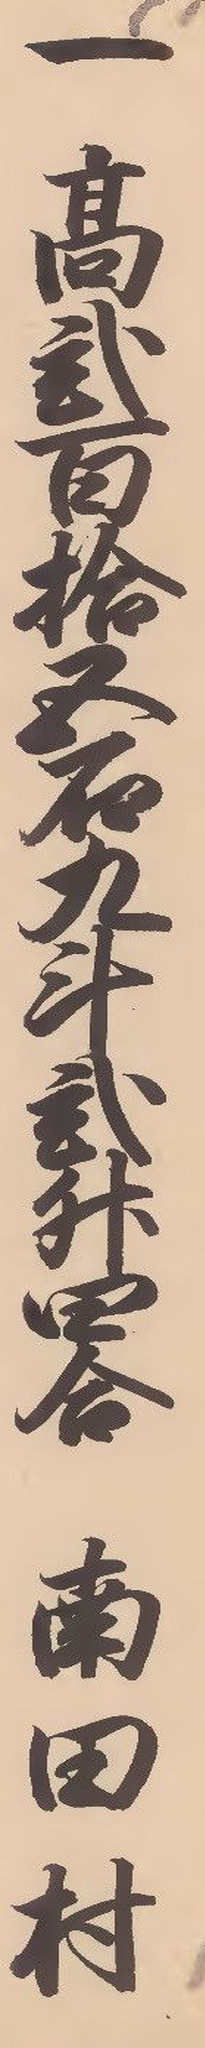一高弐百拾五石九斗弐升四合南田村
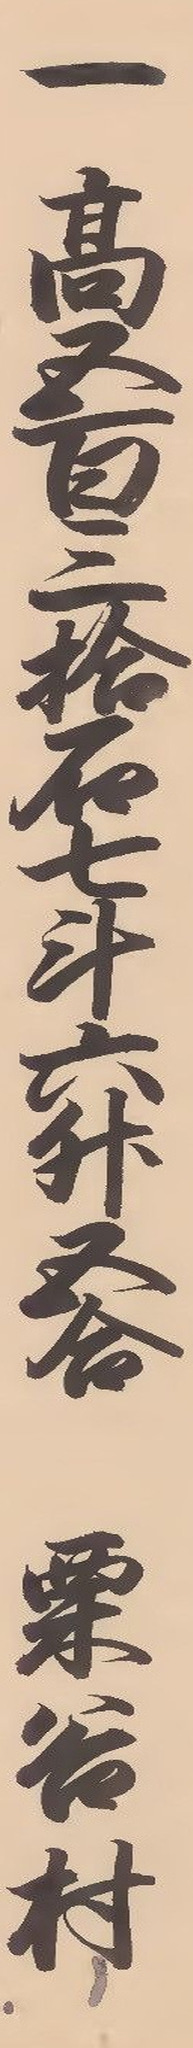一高五百三拾石七斗六升五合栗谷村
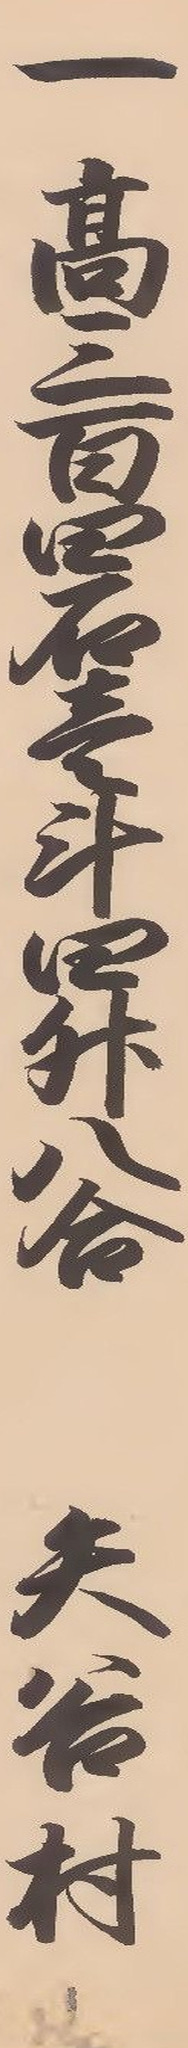一高三百四石壱斗四升八合矢谷村
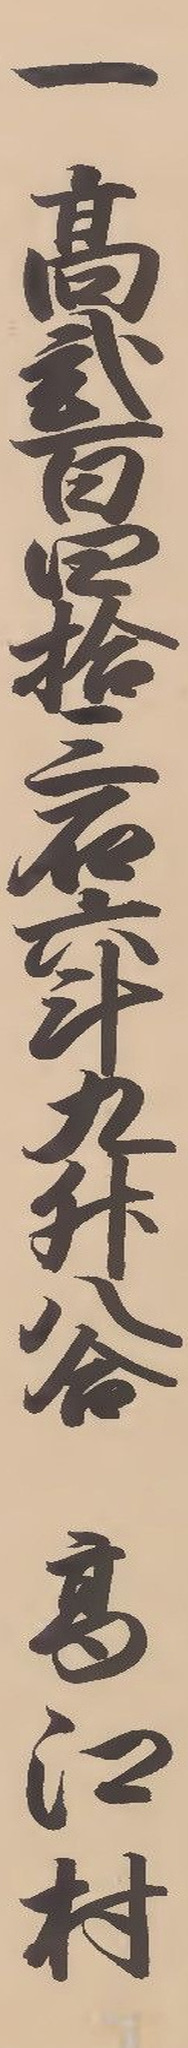一高弐百四拾三石六斗九升八合高江村
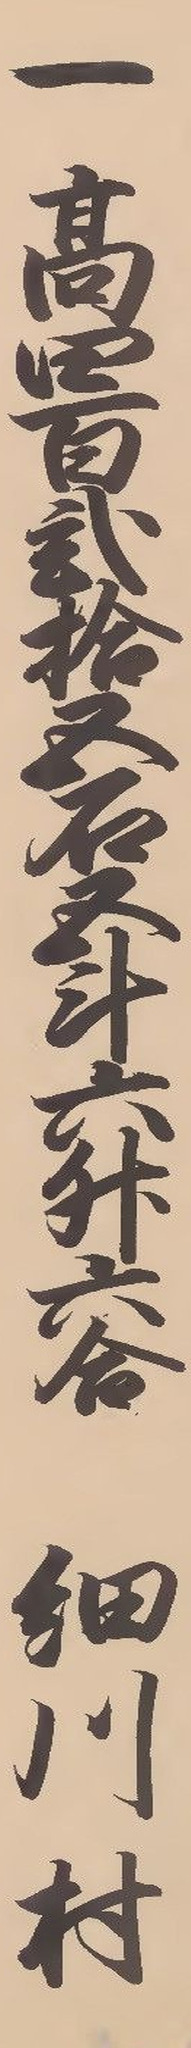一高四百弐拾五石五斗六升六合細川村
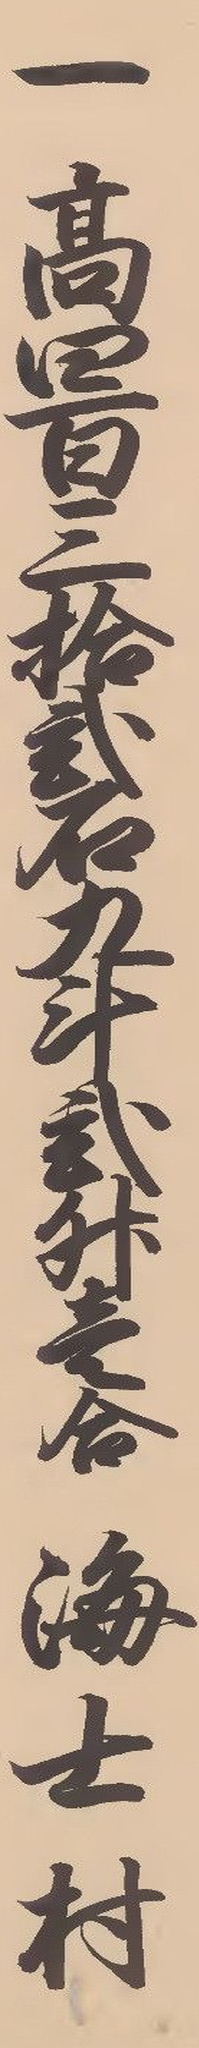一高四百三拾弐石九斗弐升壱合海士村
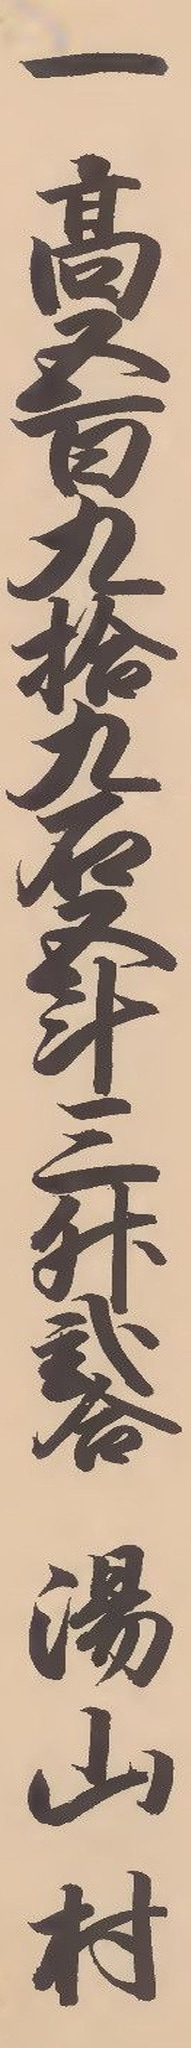一高五百九拾九石五斗三升弐合湯山村

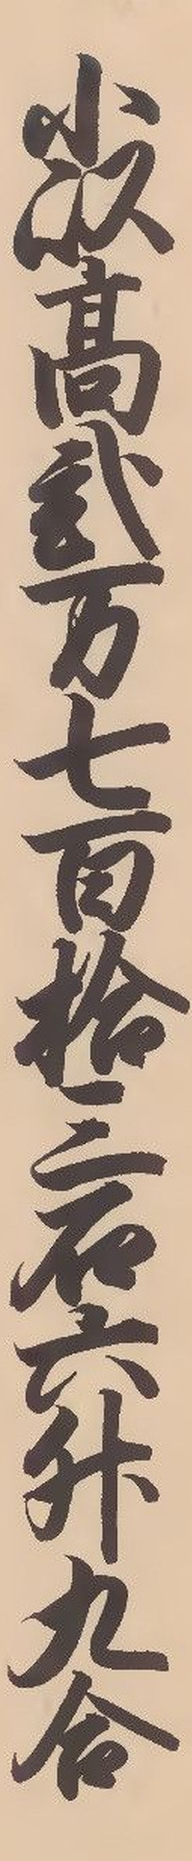小以高弐万七百拾三石六升九合
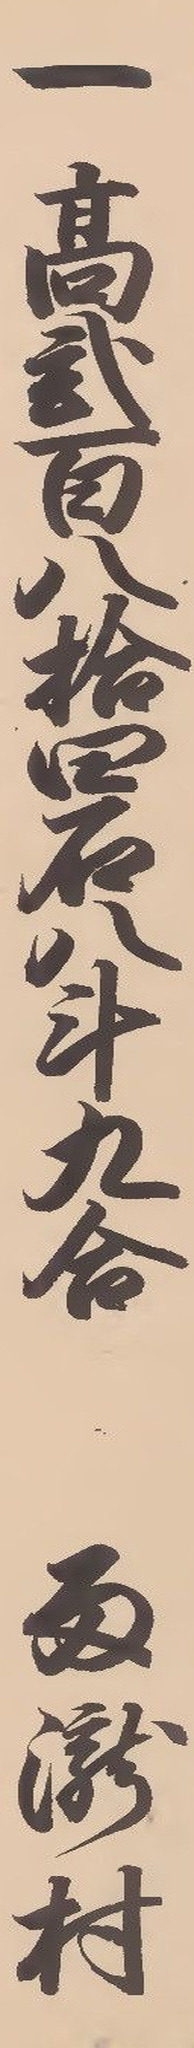一高弐百八拾四石八斗九合雨滝村
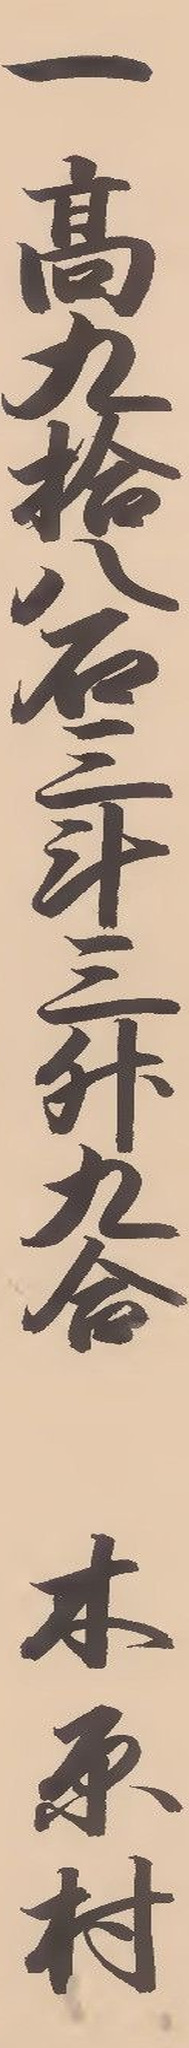一高九拾八石三斗三升九合木原村

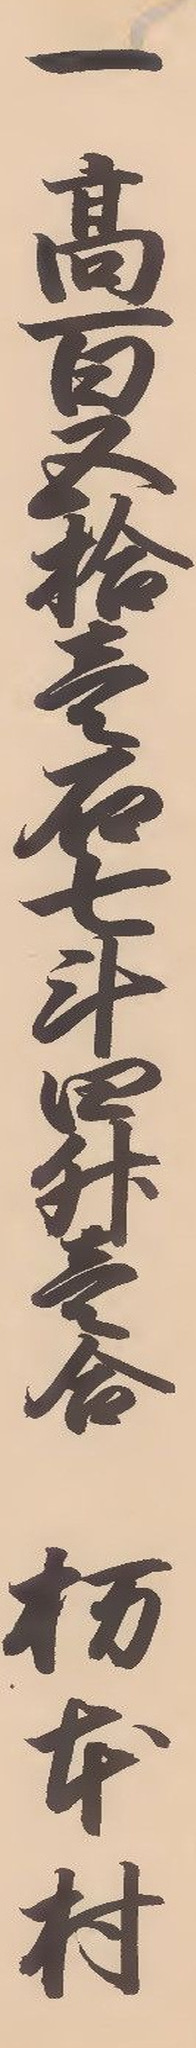一高百五拾壱石七斗四升壱合栃本村
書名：因幡国郷帳
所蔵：国立公文書館 National Archives of Japan
